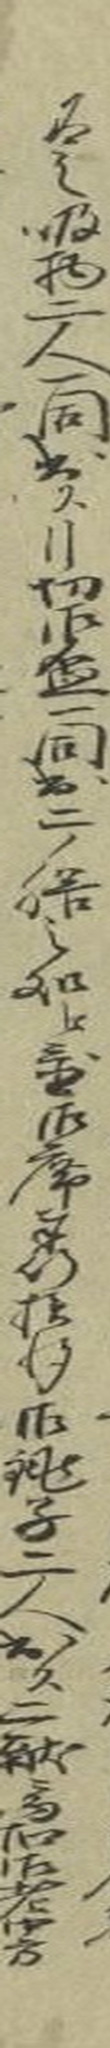有之吸物二人一同出す引切御盃一同出二の膳之処え置御席奉行挨拶御銚子二人出す二献にて扣御老中方
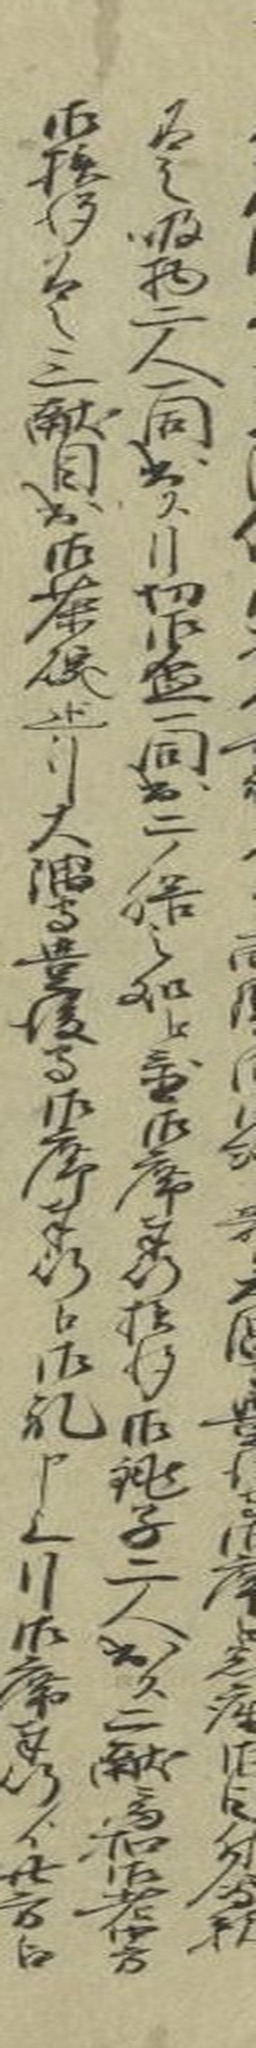御挨拶有之三献目出御茶碗迄引大隅守豊後守御席奉行え御礼申上引御席奉行ゟ此方え
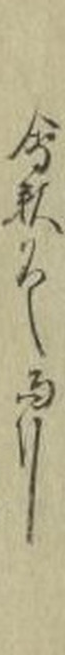会釈有之て引
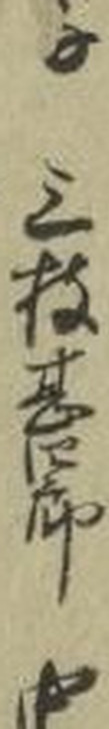三枝甚四郎

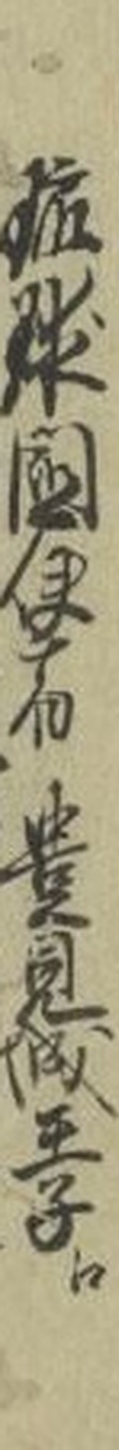琉球国使者豊見城王子え
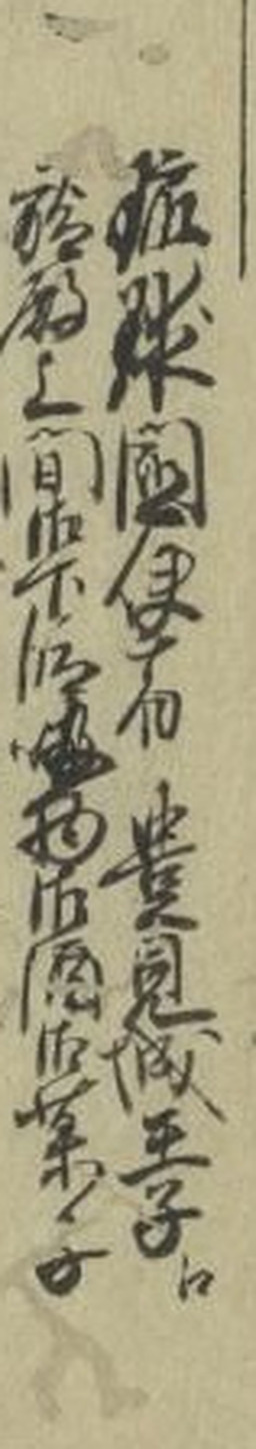於殿上間御下段吸物御酒御菓子
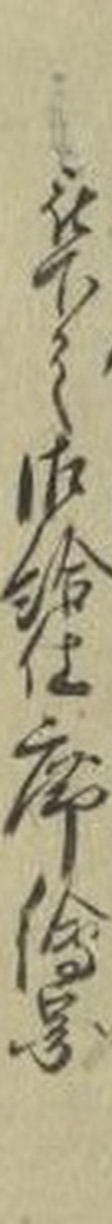被下之御給仕席絵図
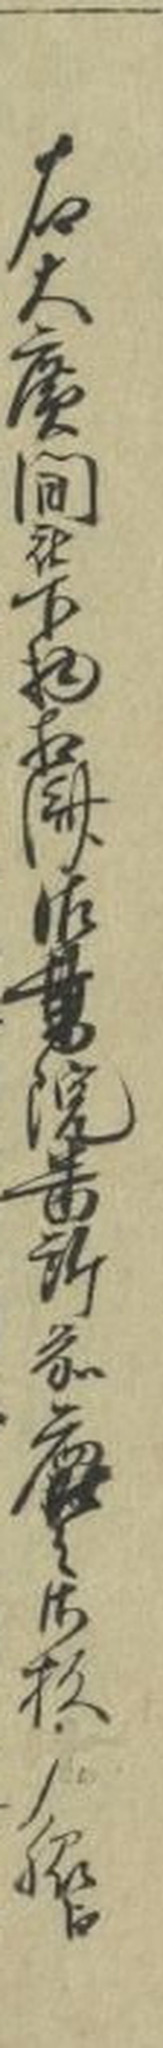右大広間被下物相済御書院番所前之御杉戸脇え
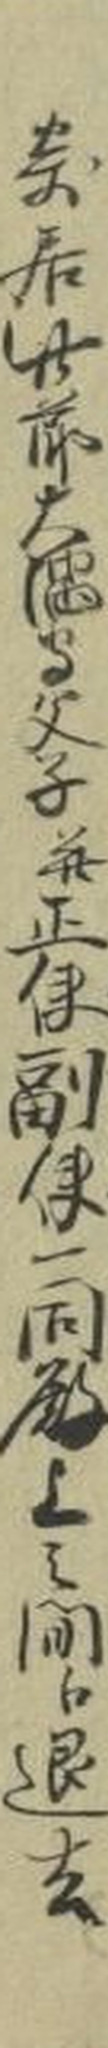寄居此節大隅守父子并正使副使一同殿上之間え退出
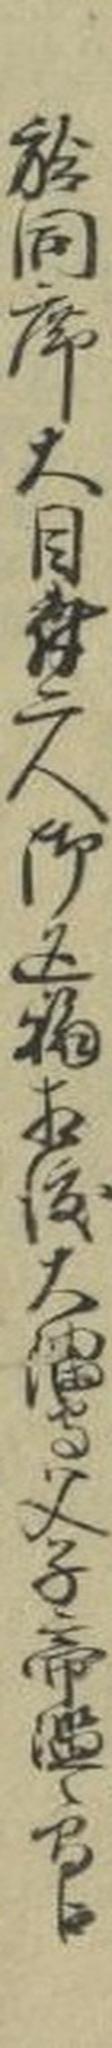於同席大目付二人御返翰相渡大隅守父子帝鑑之間え
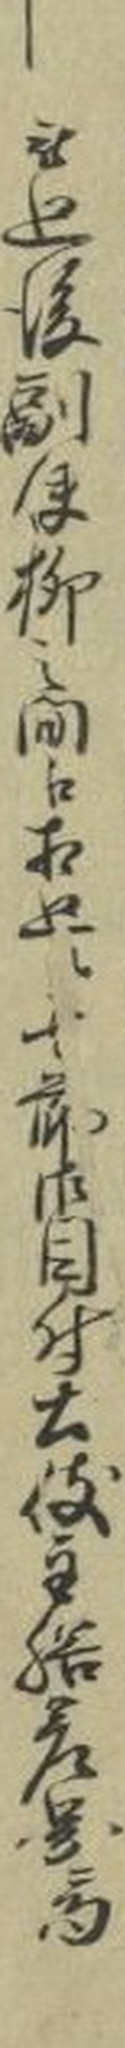被廻後副使柳之間え相廻し其節御目付土岐主膳差図にて
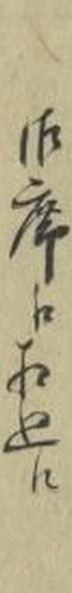御席え相廻る
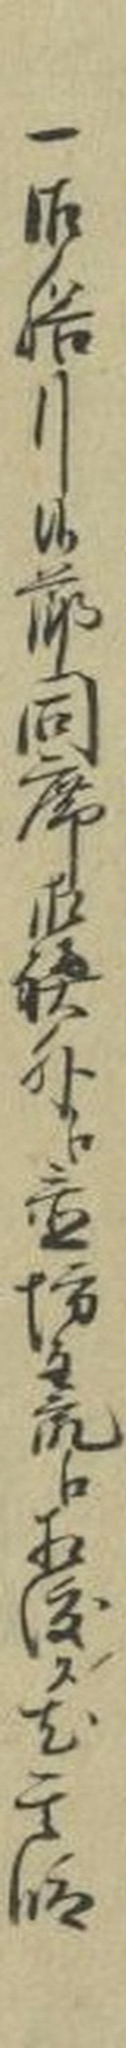一御膳引候節同席御襖外え置坊主衆え相渡す尤其段
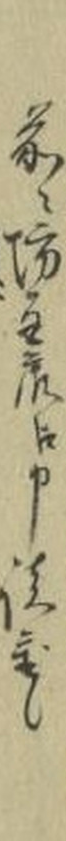前に坊主衆え申談置候
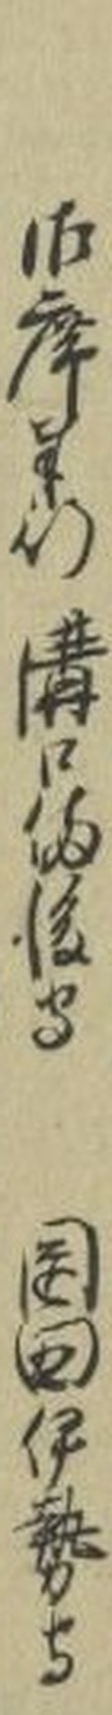御席奉行溝口備後守岡田伊勢守
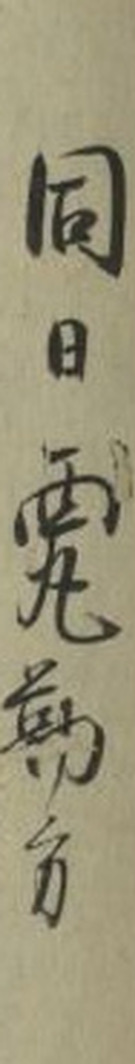同日西丸勤方
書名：天保三壬辰年琉球人参府之節勤方書留
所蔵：University of the Ryukyus Library
